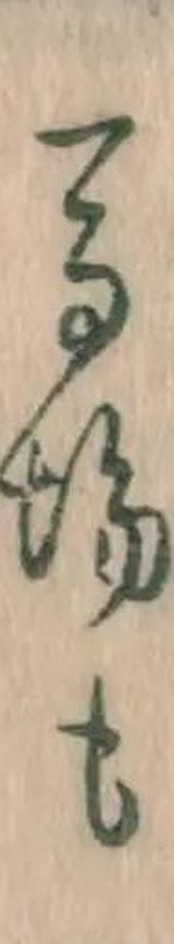馬場も
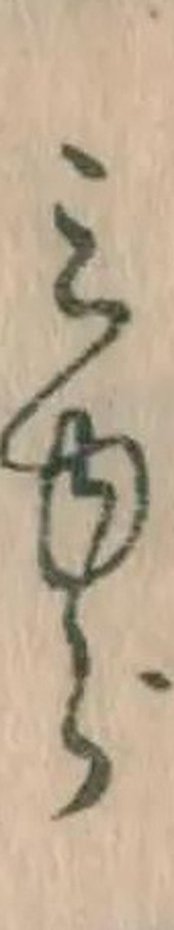みゆら
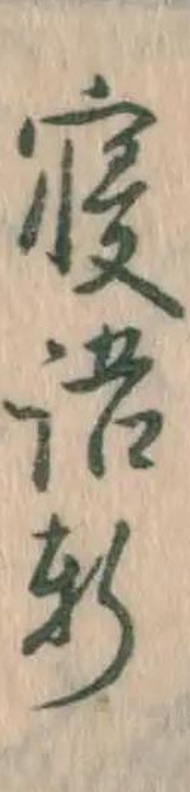寝語軒

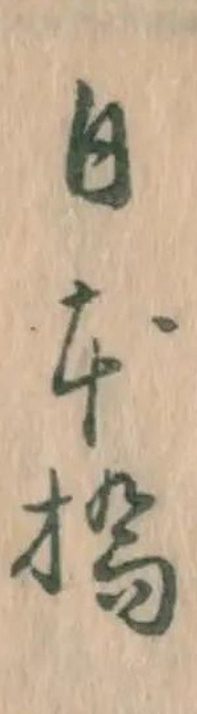日本橋
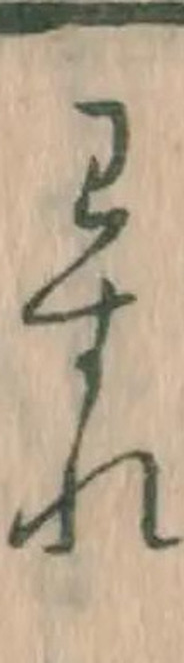わすれ
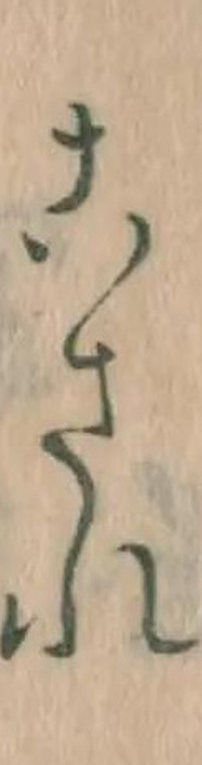こされ

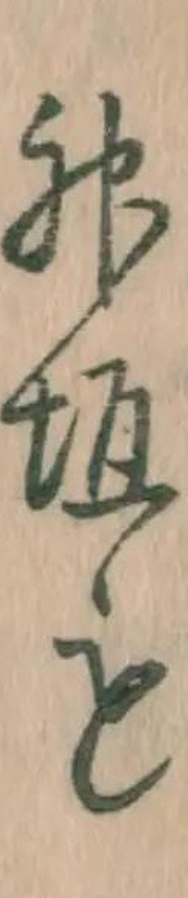神垣も
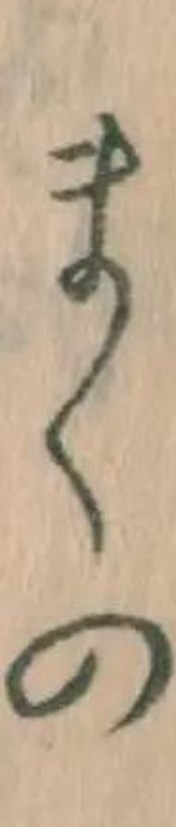まくの

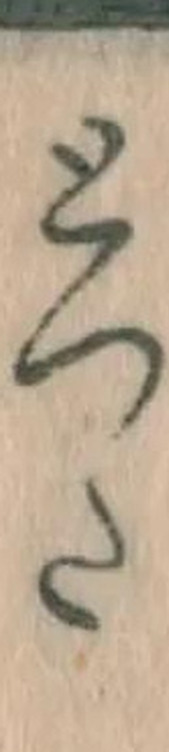とつた
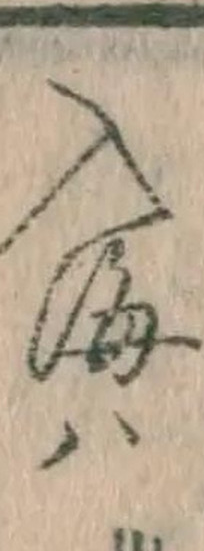入海は
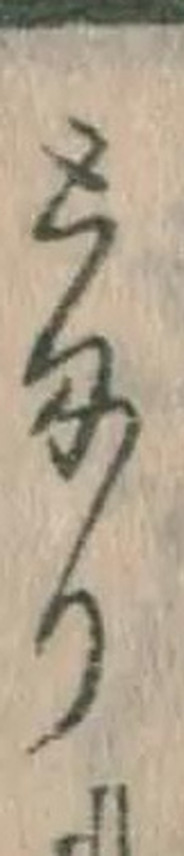とまり
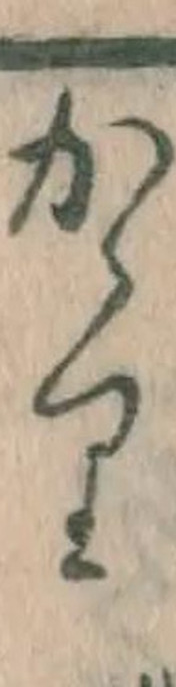かゝり
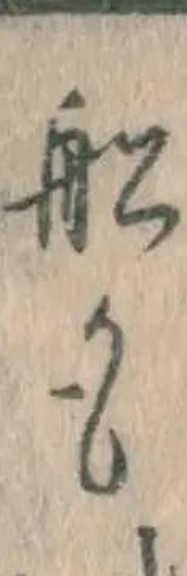船かも
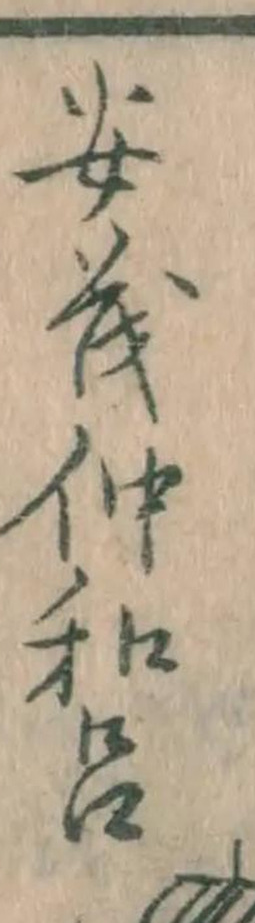安茂仲和呂

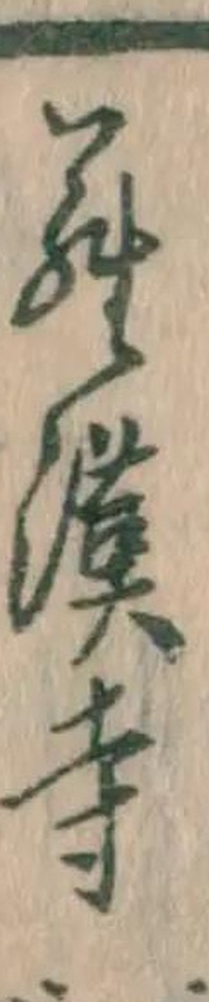羅漢寺
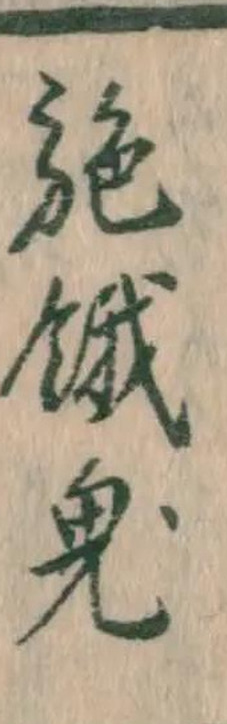施餓鬼
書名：駿河舞 3巻
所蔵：国立国会図書館 National Diet Library, JAPAN
